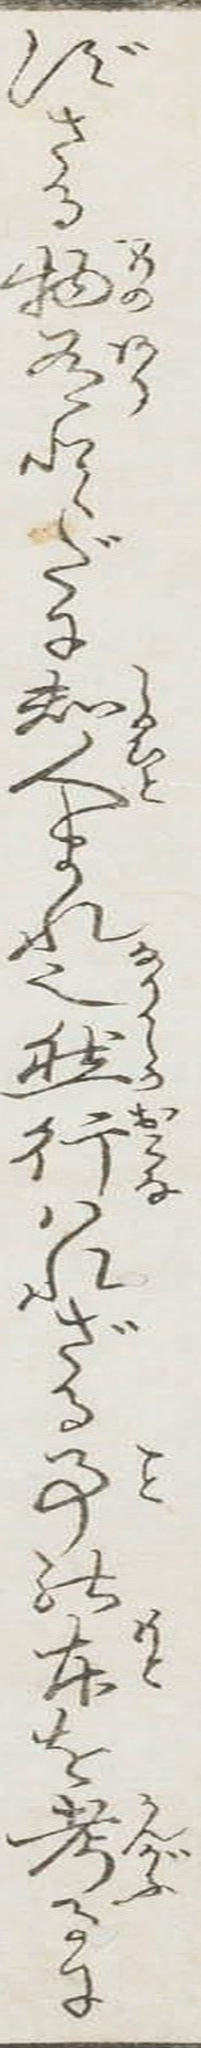ずさる物有とだに知人まれ也然行はれざる事の本を考るに
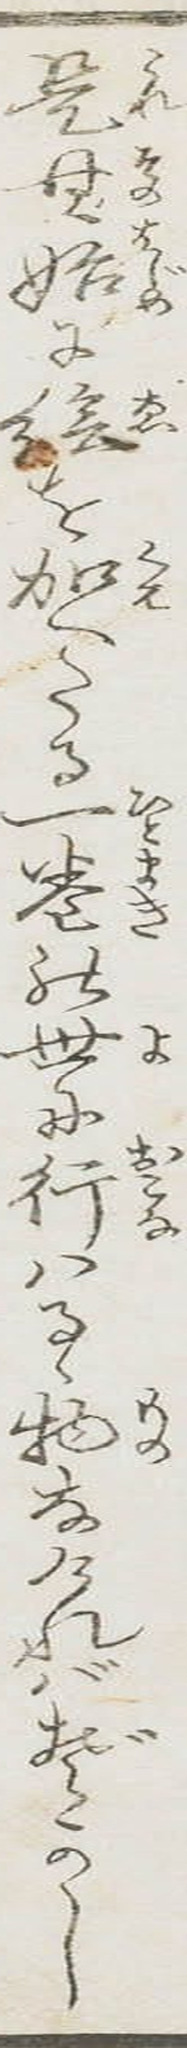是其始に絵を加へたる一巻の世に行はるゝ物なければぞかし
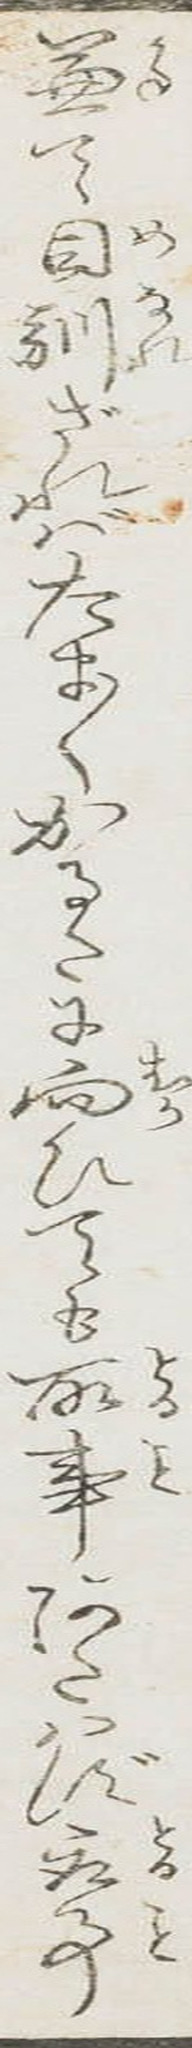兼て目馴ざればたま〳〵かるたに向ひても取事あたはず取事
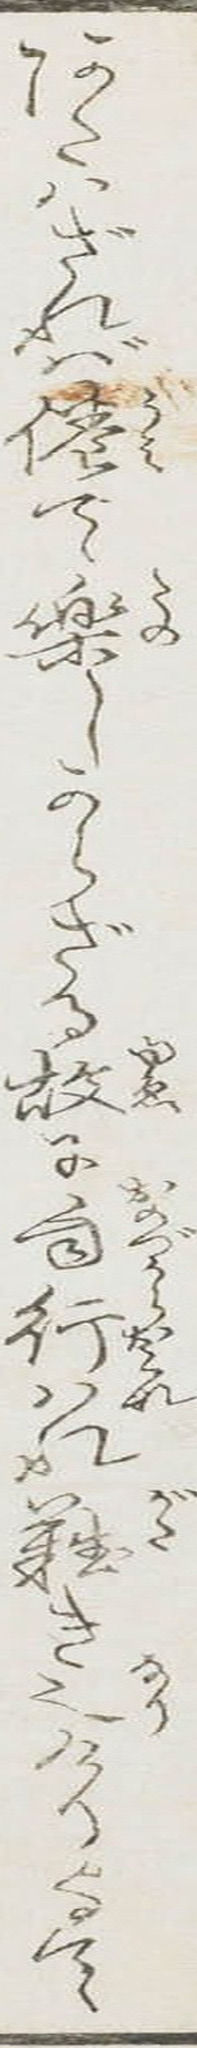あたはざれば倦て楽しからざる故に自行はれ難き也けりよて
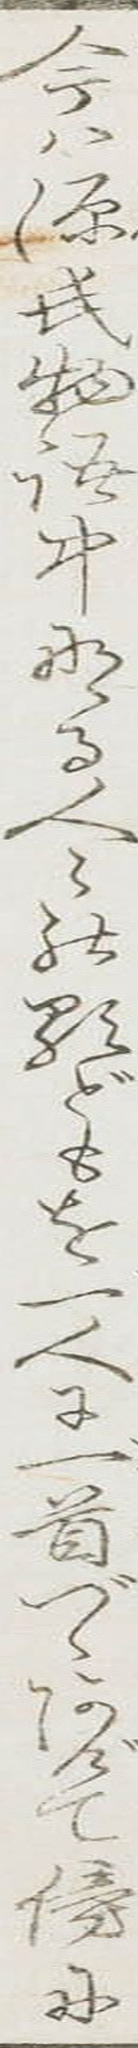今は源氏物語中なる人々の歌どもを一人に一首づゝあげて傍に
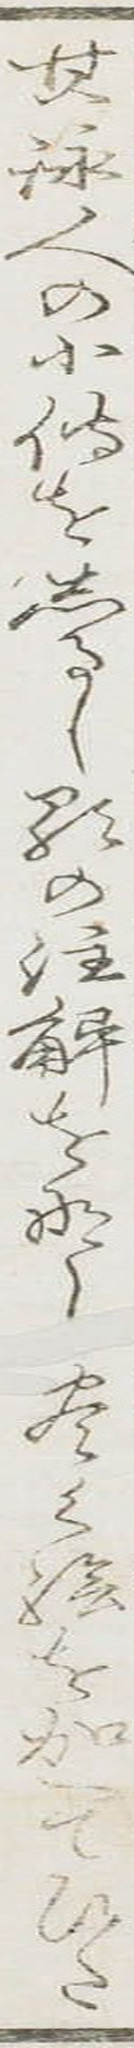其詠人の小伝をしるし歌の注解をなし尽く絵を加へてひた
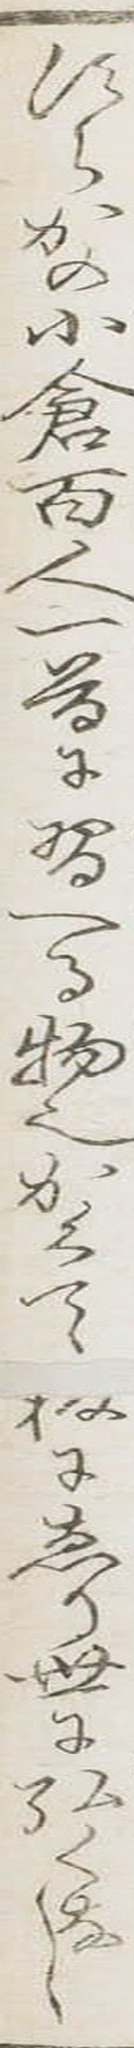すらかの小倉百人一首に習へる物也かくて板にゑり世に弘くなし
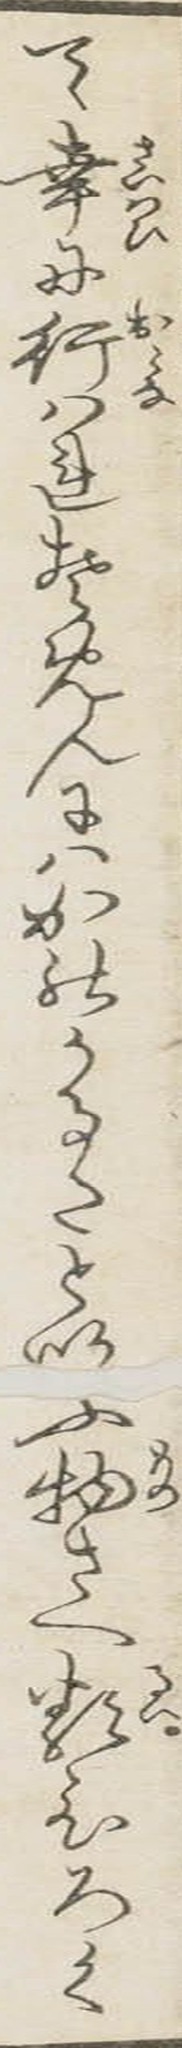て幸に行はれそめんにはかのかるたといふ物さへ類ひろく
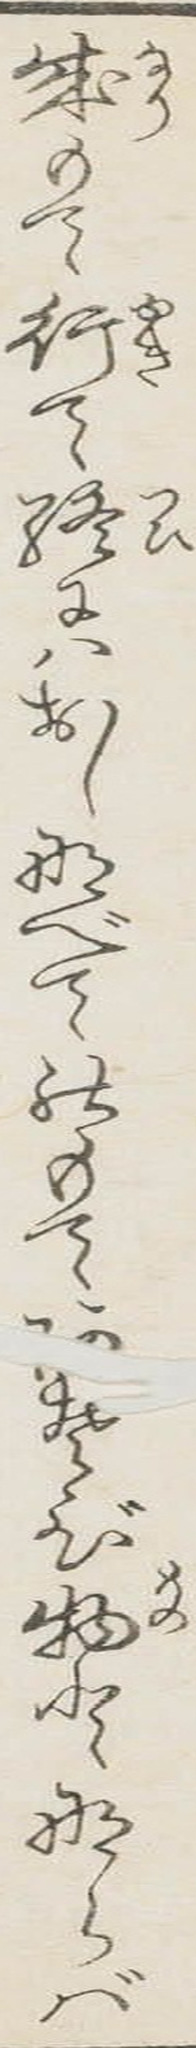成もて行て終にはおしなべてのもてあそび物とならば
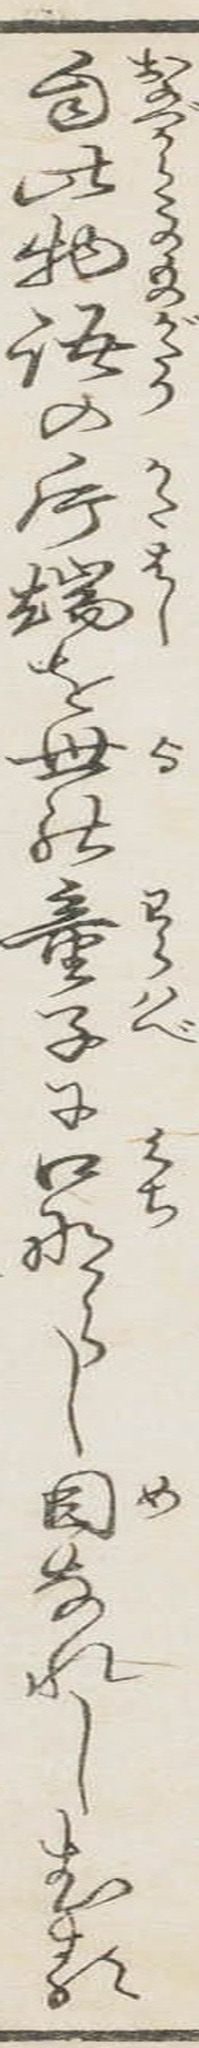自此物語の片端を世の童子に口ならし目なれしむる
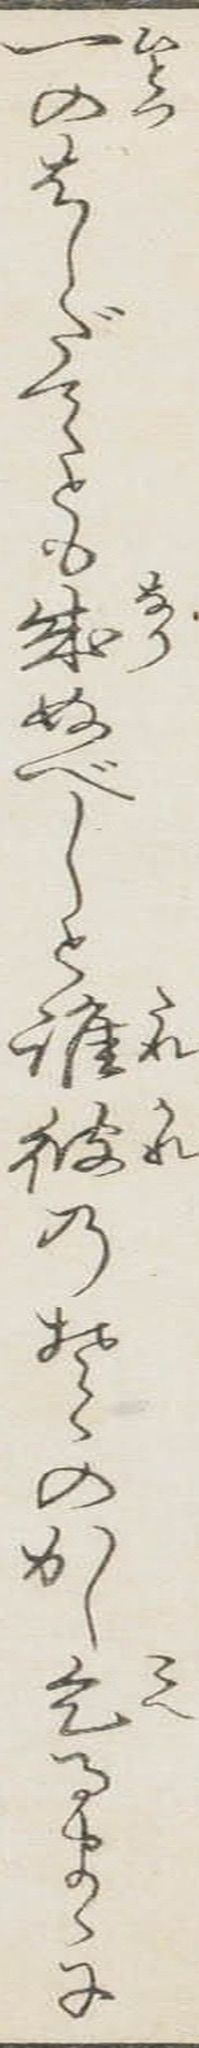一のはしだてとも成ぬべしと誰彼のそゝのかし乞るまゝに
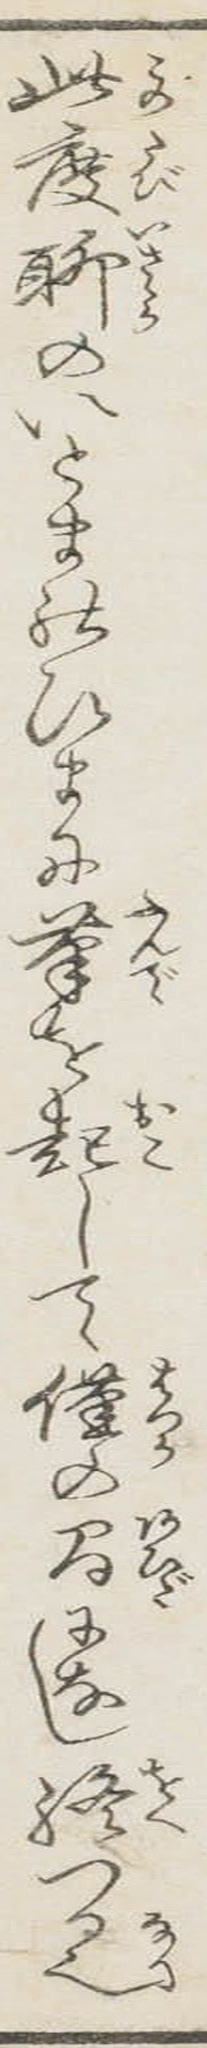此度聊のいとまのひまに筆を起して僅の間になし終つる也
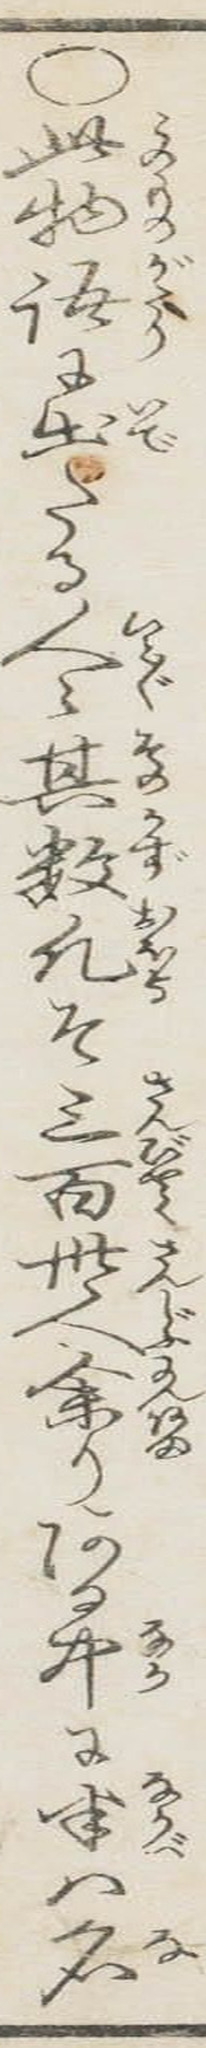○此物語に出たる人々其数凡そ三百卅人余りある中に半は名
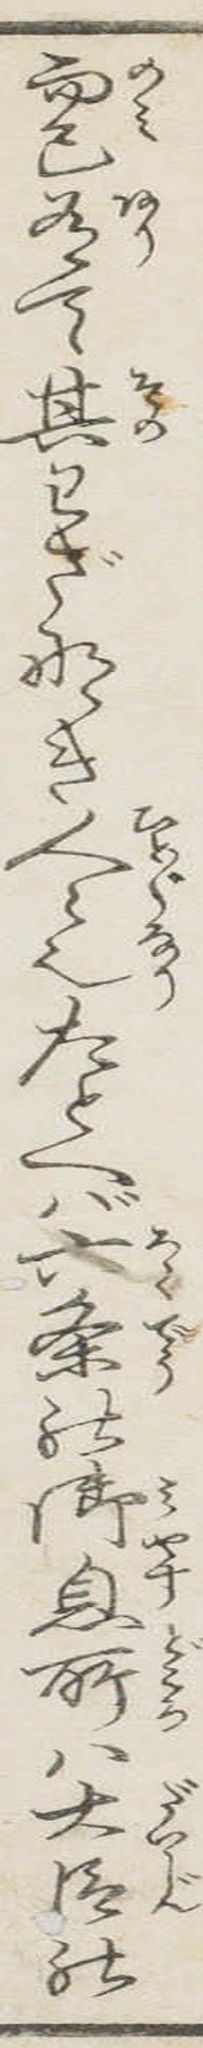而已有て其わざなき人々也たとへば六条の御息所は大臣の
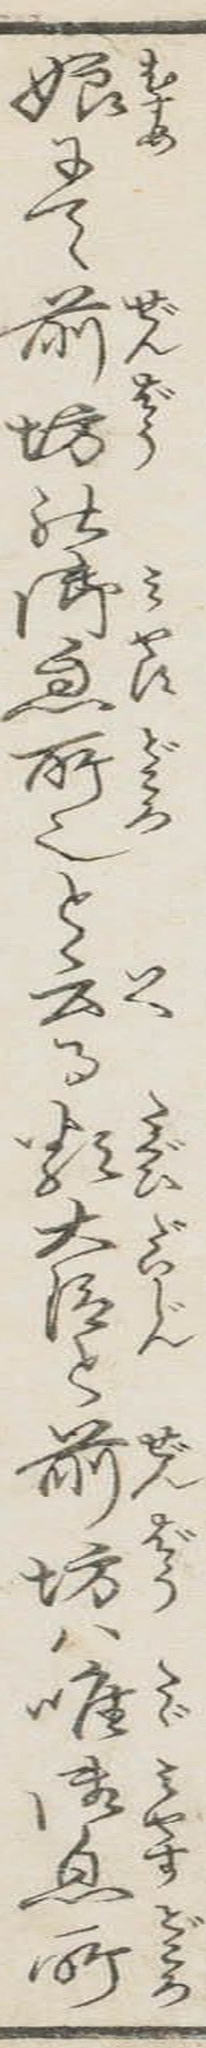娘にて前坊の御息所也と云る類大臣と前坊は唯御息所
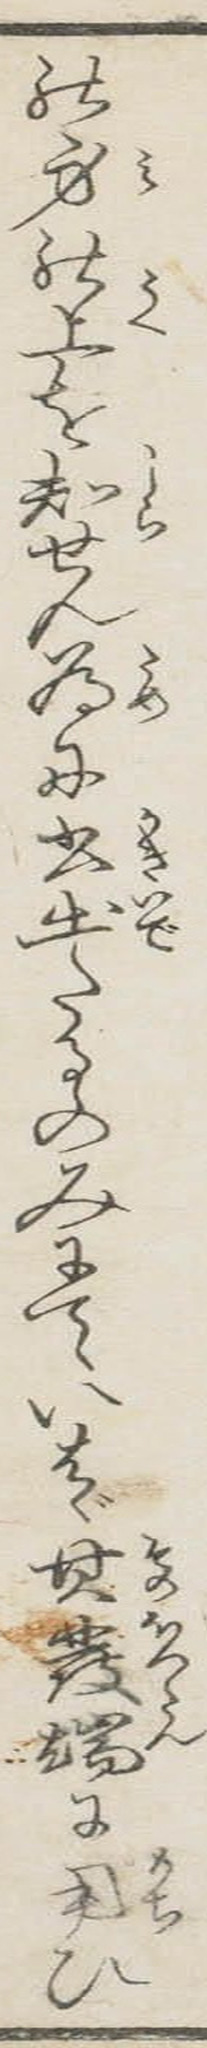の身の上を知せん為に書出たるのみにていはゞ其発端に用ひ
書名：源氏百人一首
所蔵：東京学芸大学教育コンテンツアーカイブ
